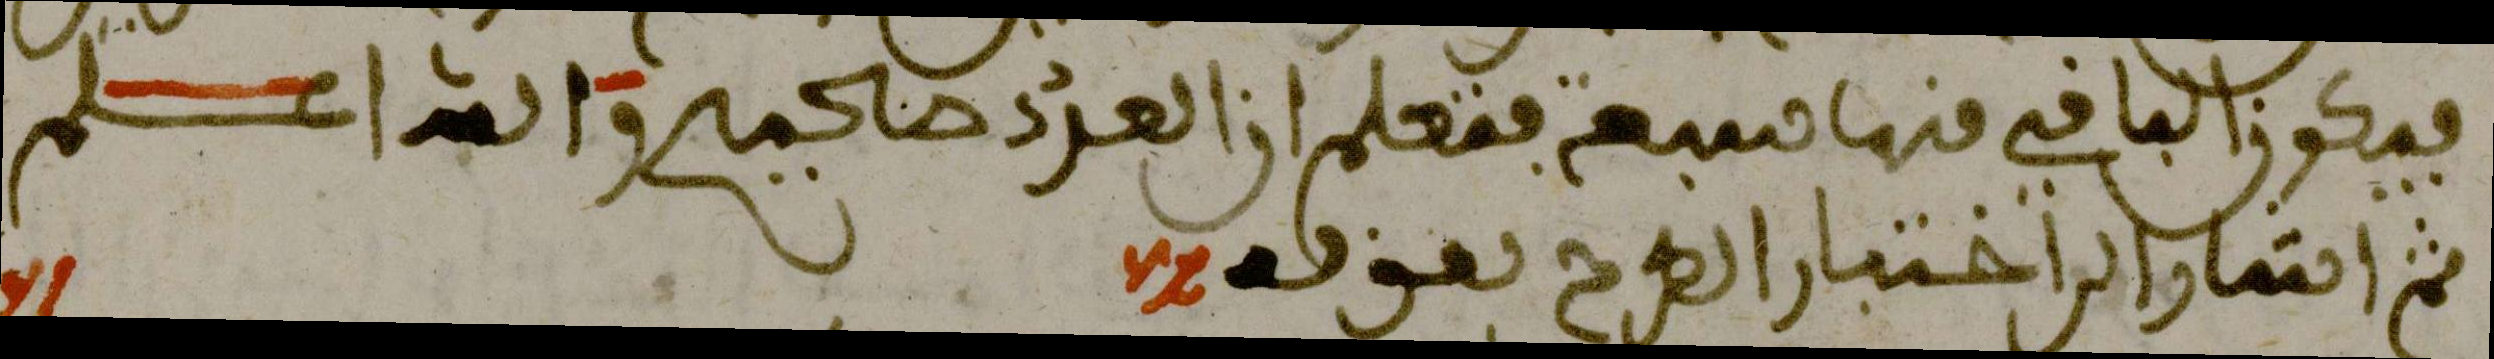فيكون الباقي منهما سبعة فتعلم ان العدد صحيح والله اعلم
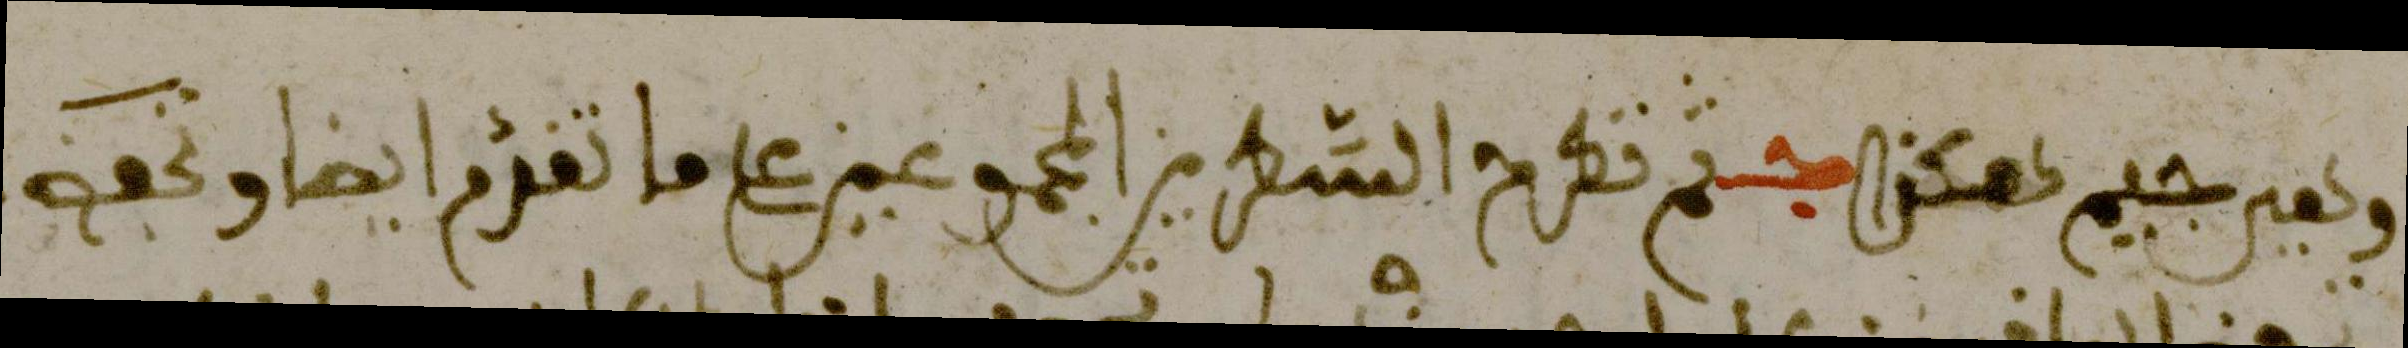و هي جيم هكذا ج ثم تطرح السّطر من المجموعين على ما تقدم ايضا و تحفض
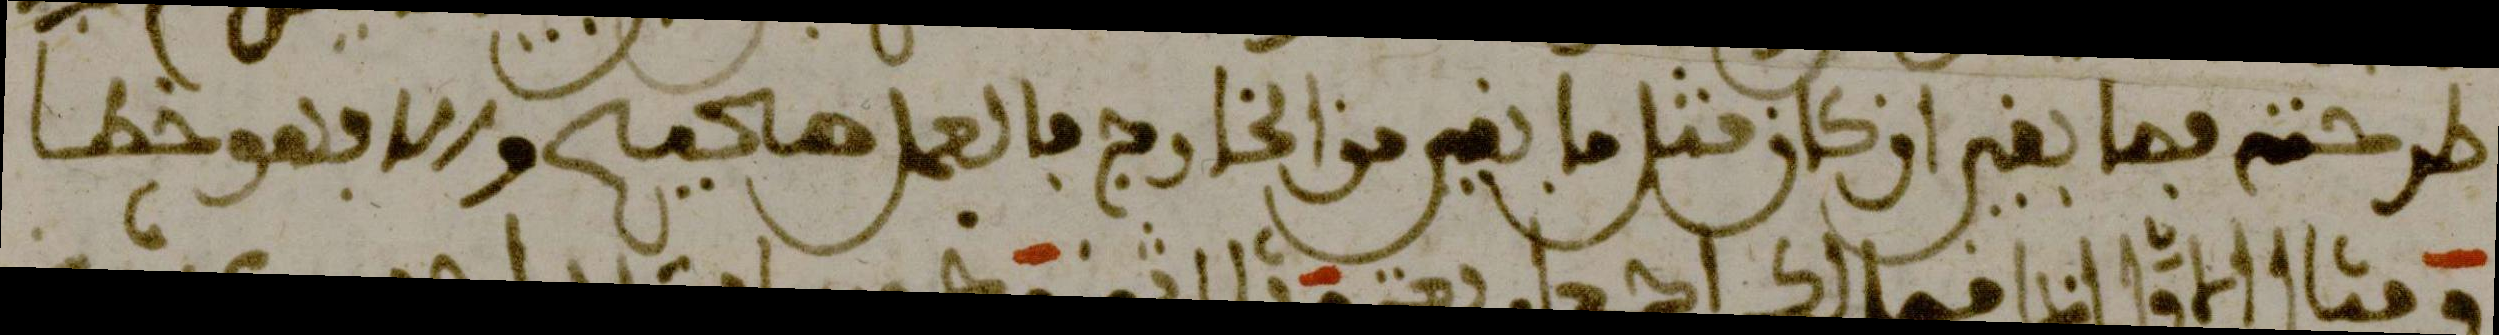طرحته فما بقي ان كان مثل ما بقي من الخارج فالعمل صحيح والا فهو خطا
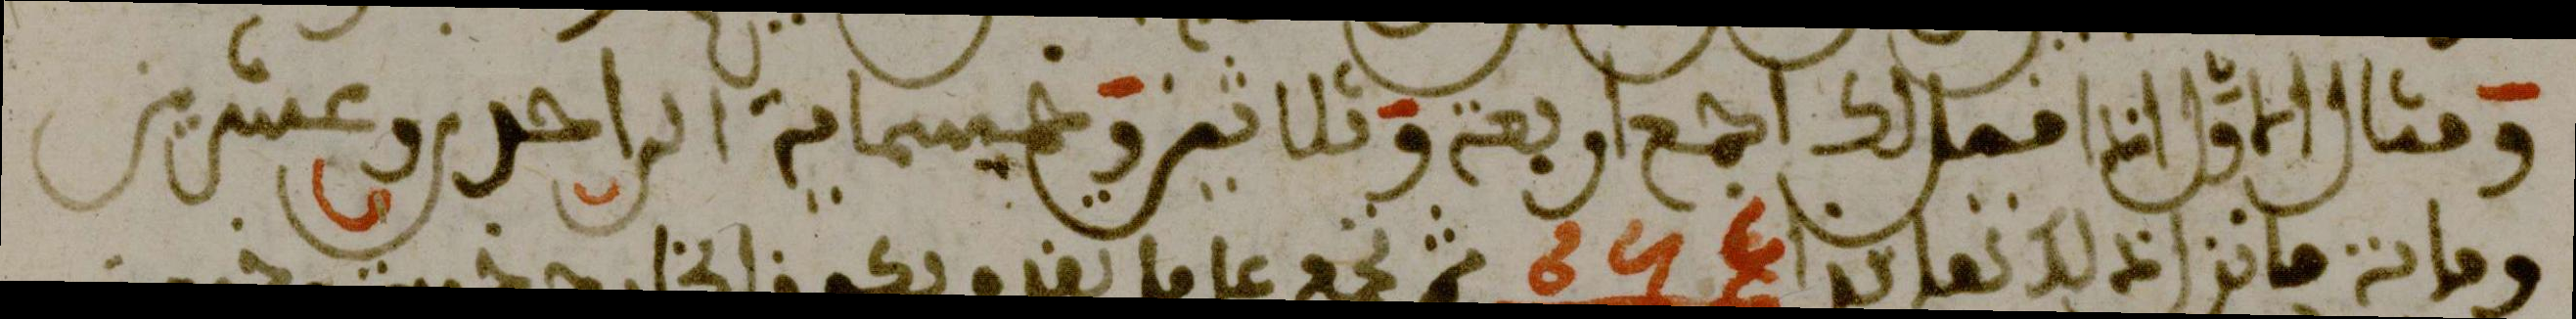ومثال الاوّل اذا قيل لك اجمع اربعة و ثلاثين و خمسماية الى احد وعشرين
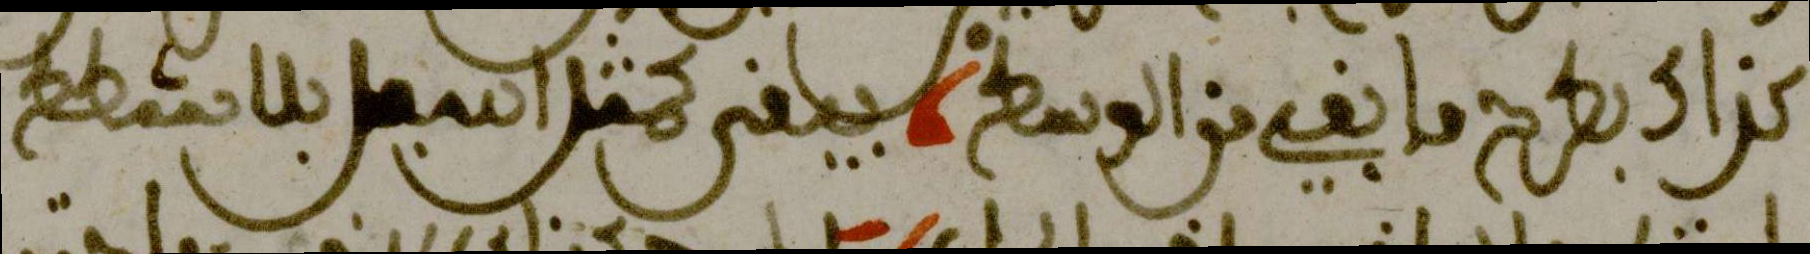كذاك بطرح ما بقي من الوسط يبقى كمثل اسفل بلا شطط
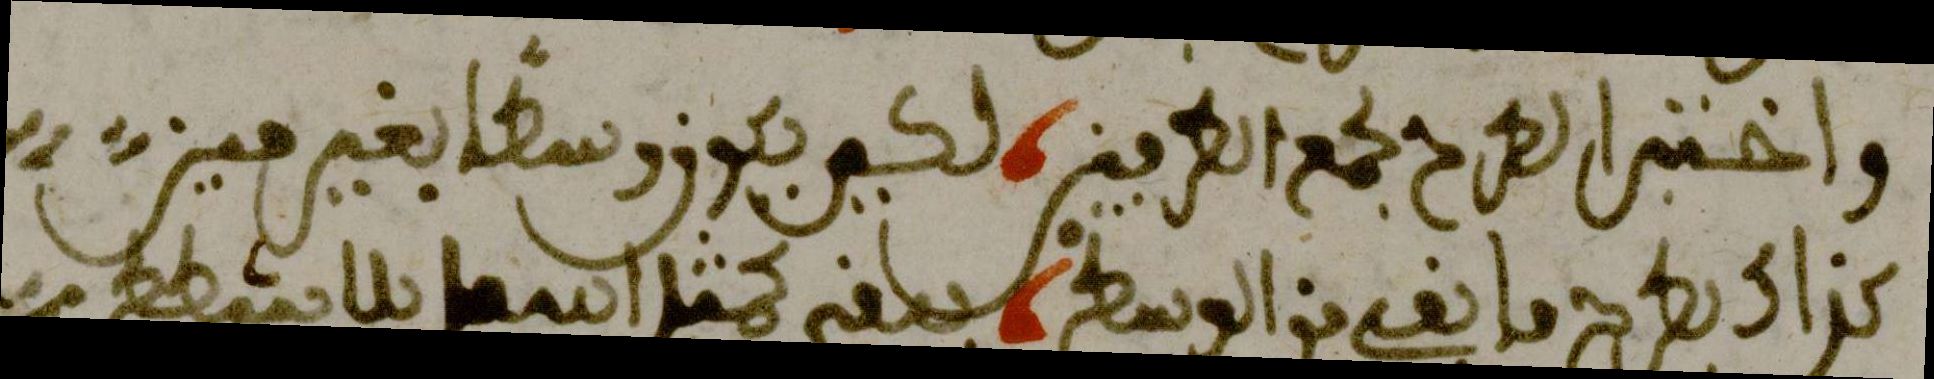و اختبر الطرح بحمع الطرفين لكي يكون وسطًا بغير ميز
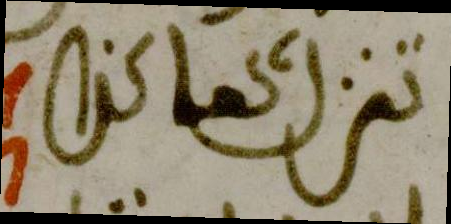تنزل هاكذا
